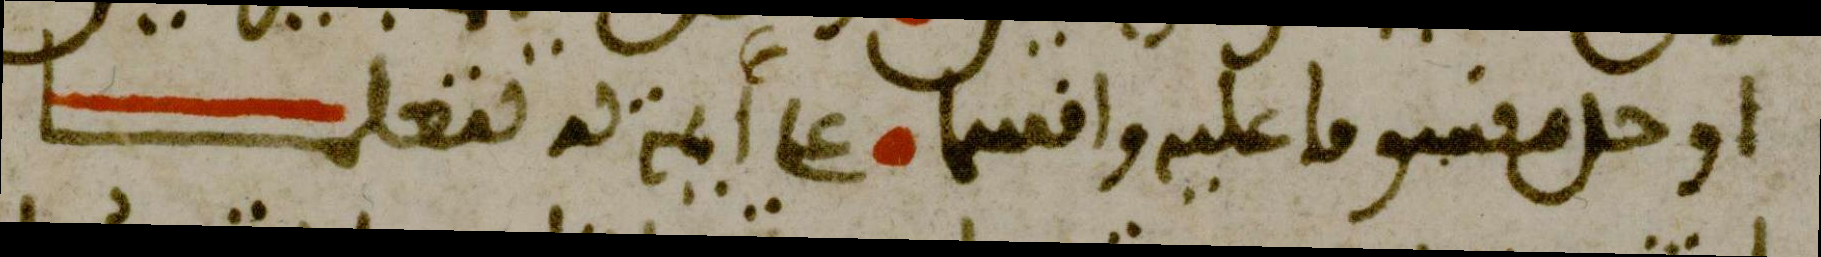او حل مقسوما عليه واقسما على ايمة تتعلما
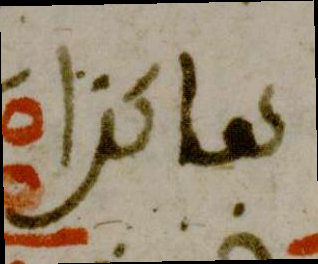هاكذا
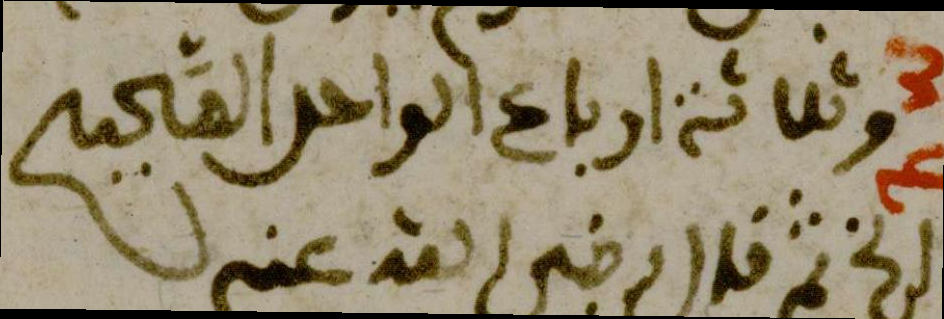وثلاثة ارباع الواحد الصحيح
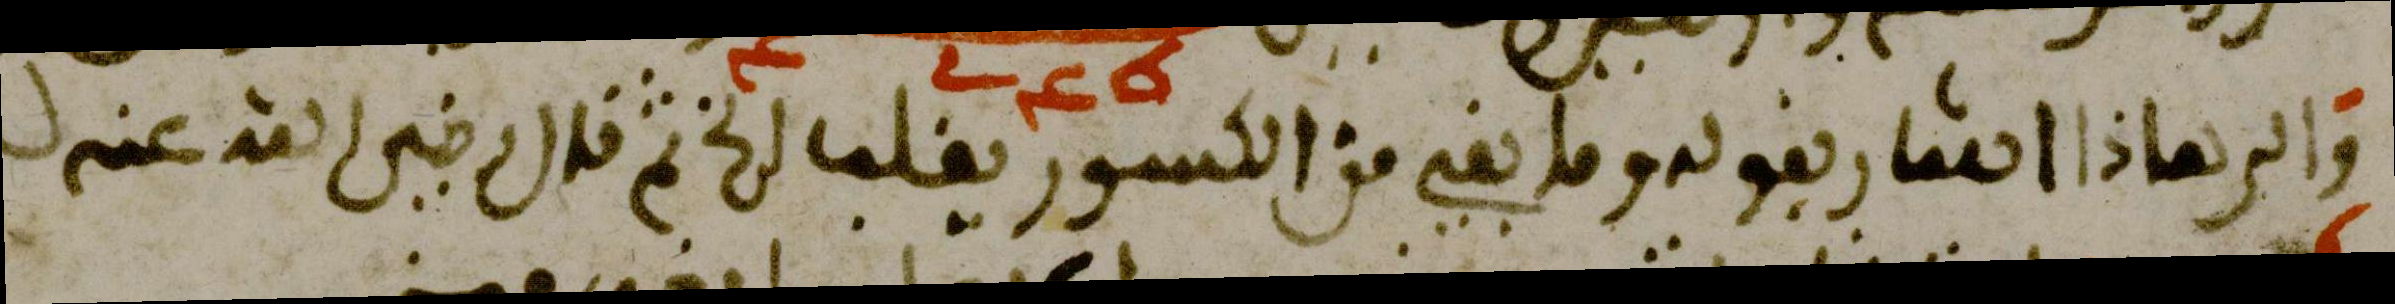وَالى هاذا اشار بقوله وما بقي من الكسور يقلب الخ ثم قال رضي الله عنه
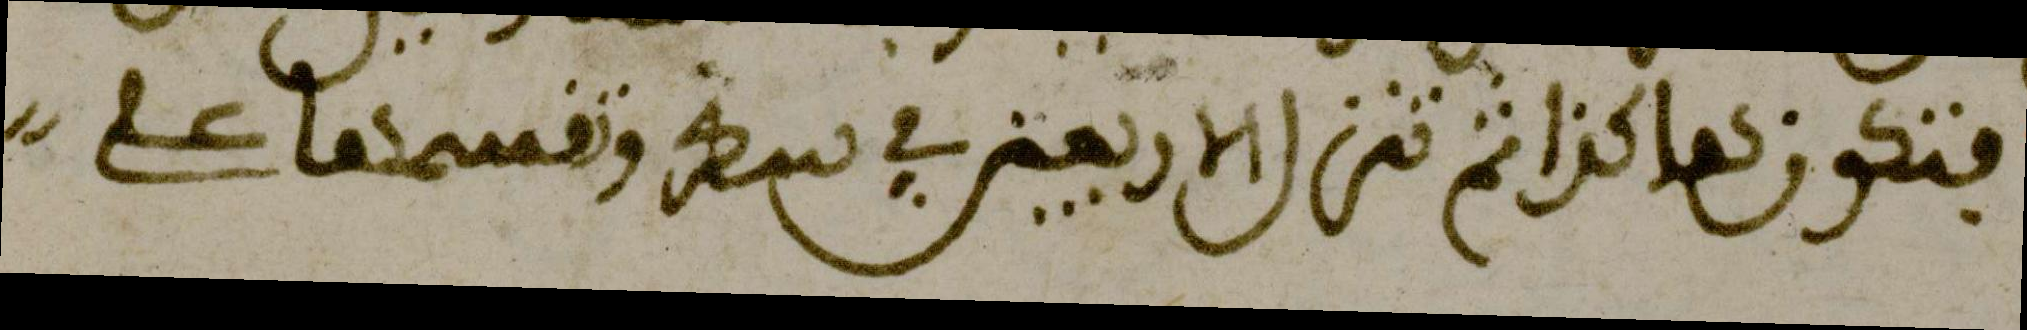فتكون هاكذا ثم تنزل الاربعين في سطر وتقسمها على
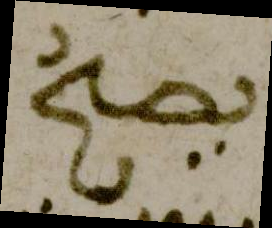يصح
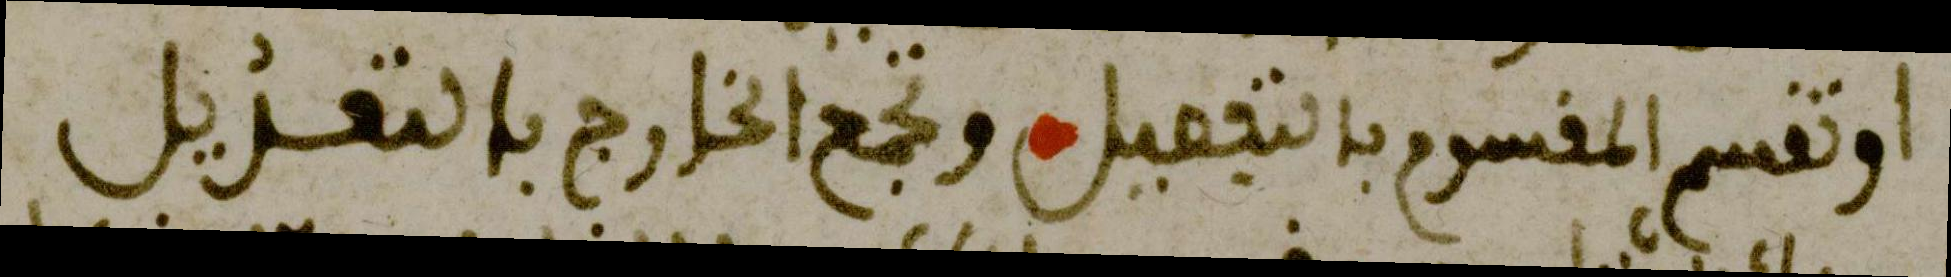او تقسم المقسوم بالتفصيل وتجمع الخارج بالتعديل
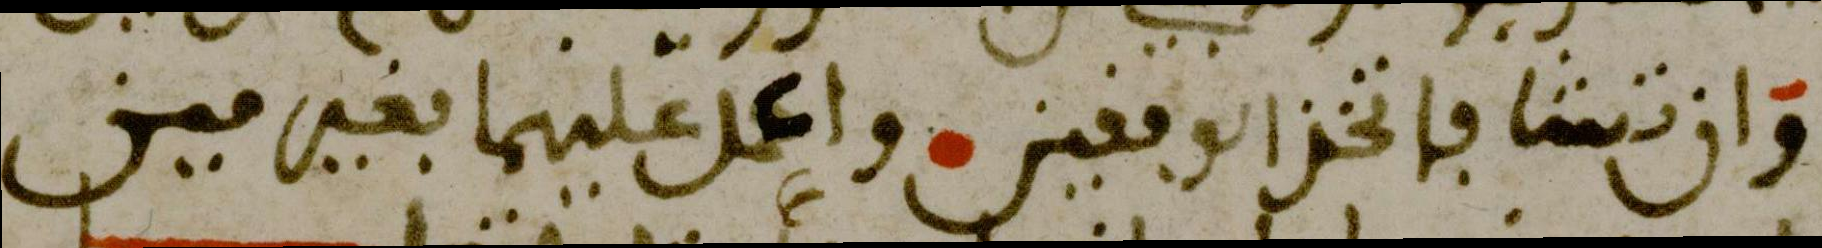وَان تشا فاتخذ الوفقين واعمل عليهما بغير مين
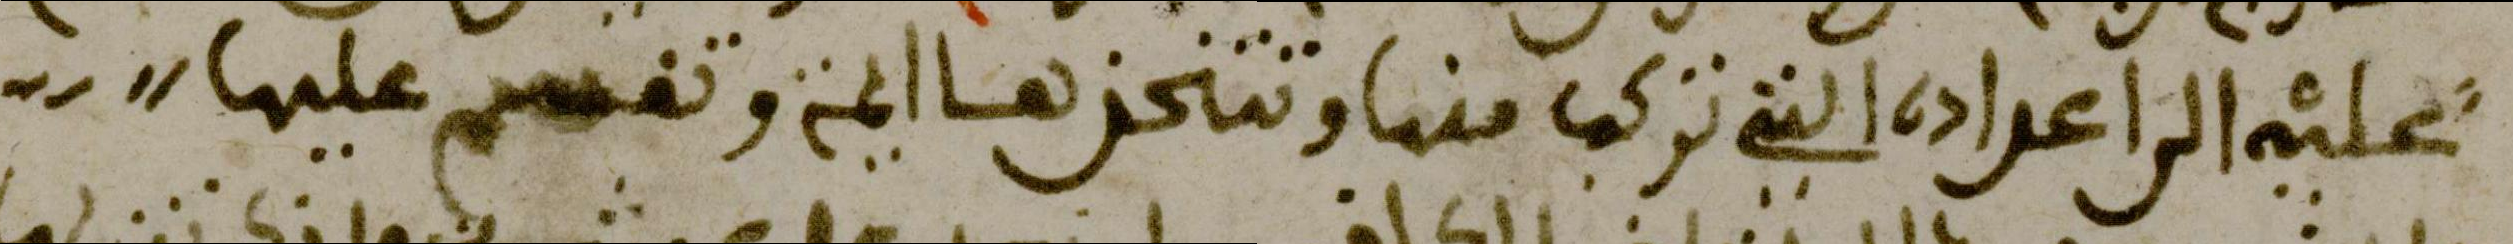عليْه الى اعداده التي تركب منها وتتخذها ايمة وتقسم عليها
